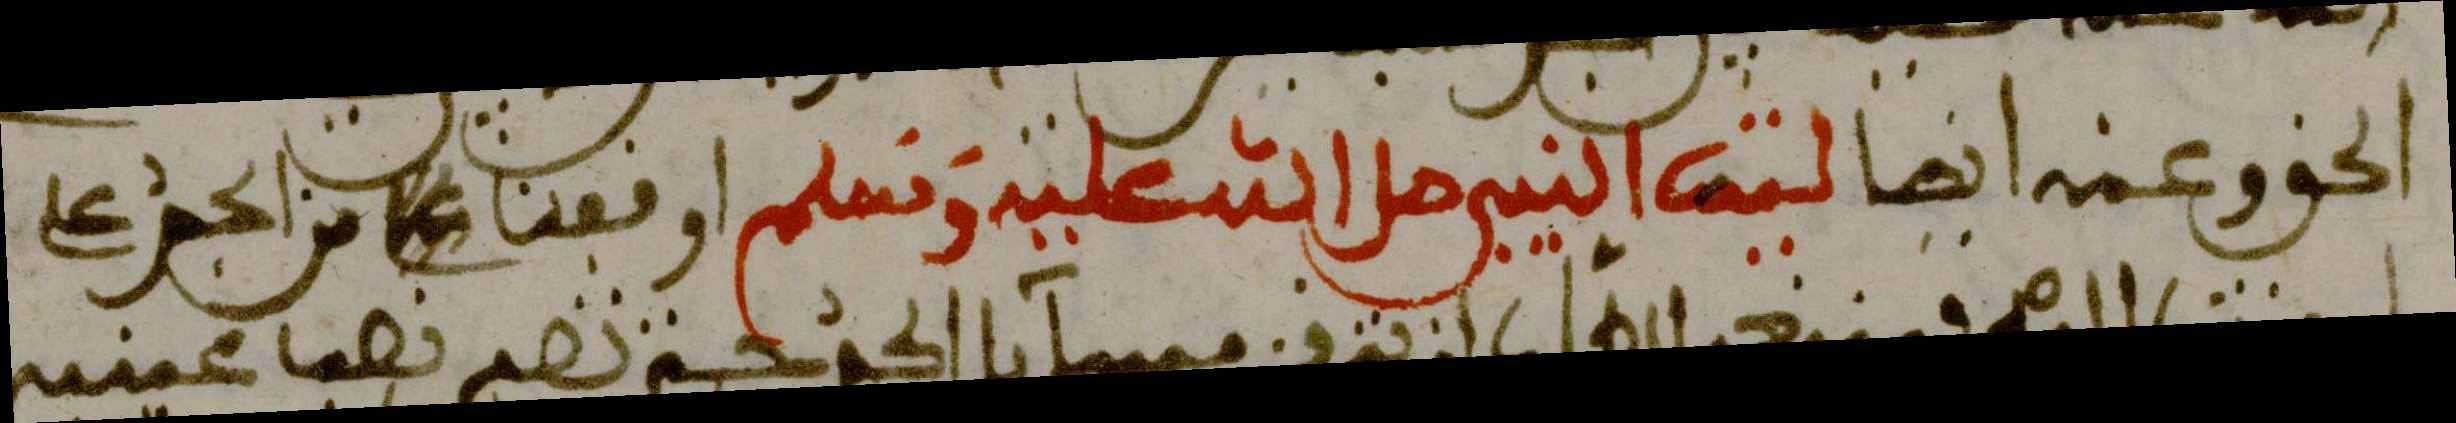الحق وعنه ايضا ليت النبي صل الله عليه وَسَلم اوقفنا على من الجد على
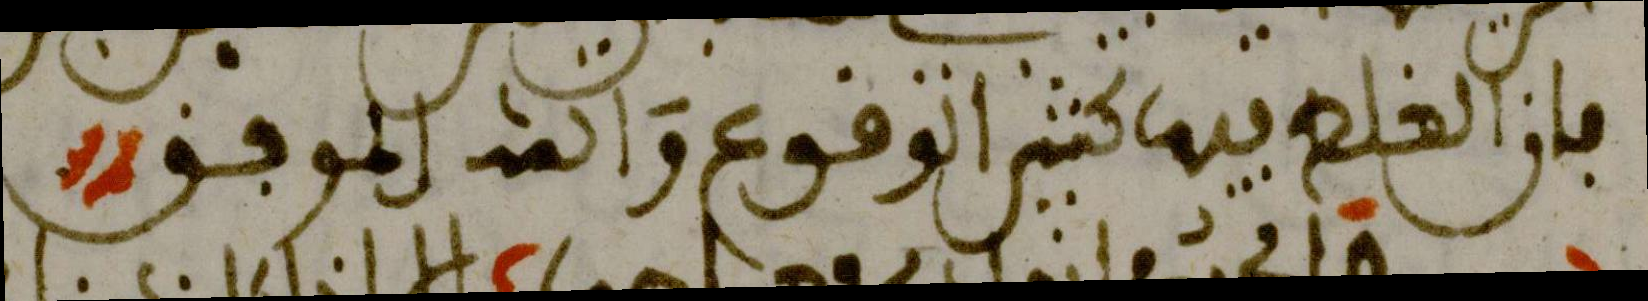فان الغلط فيها كثير الوقوع والله الموفق
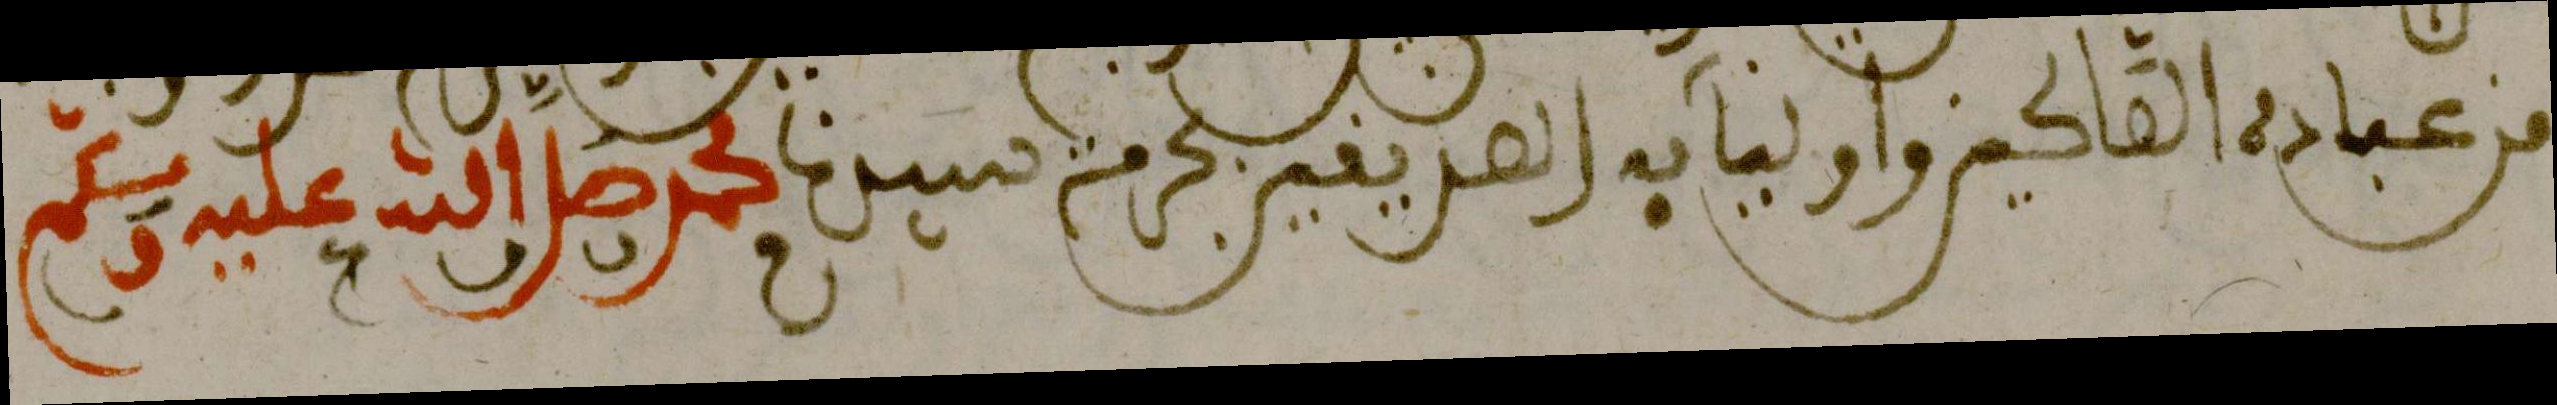من عباده الصّالحين واوليائه الصديقين بحرمة سيدنا محمد صَلّ الله عليه وسلّم
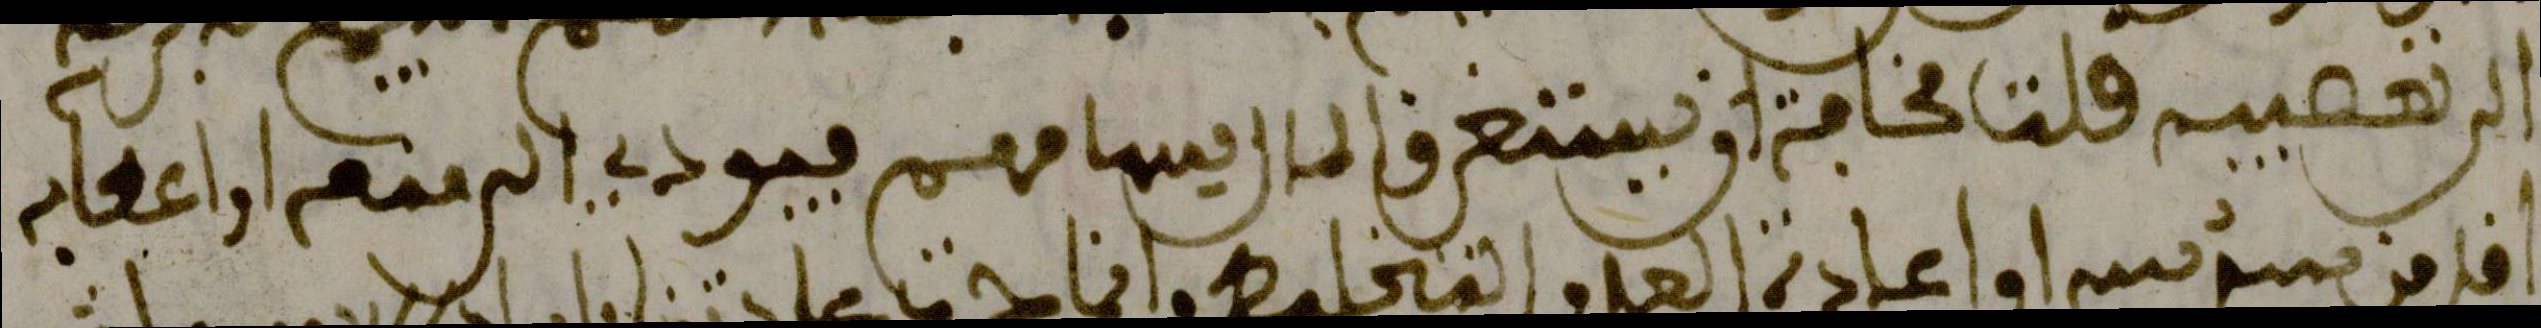الى تعصيب قلت مخافة ان يستغرق المال سِهامهم فيودي الى منعه او اعطائه
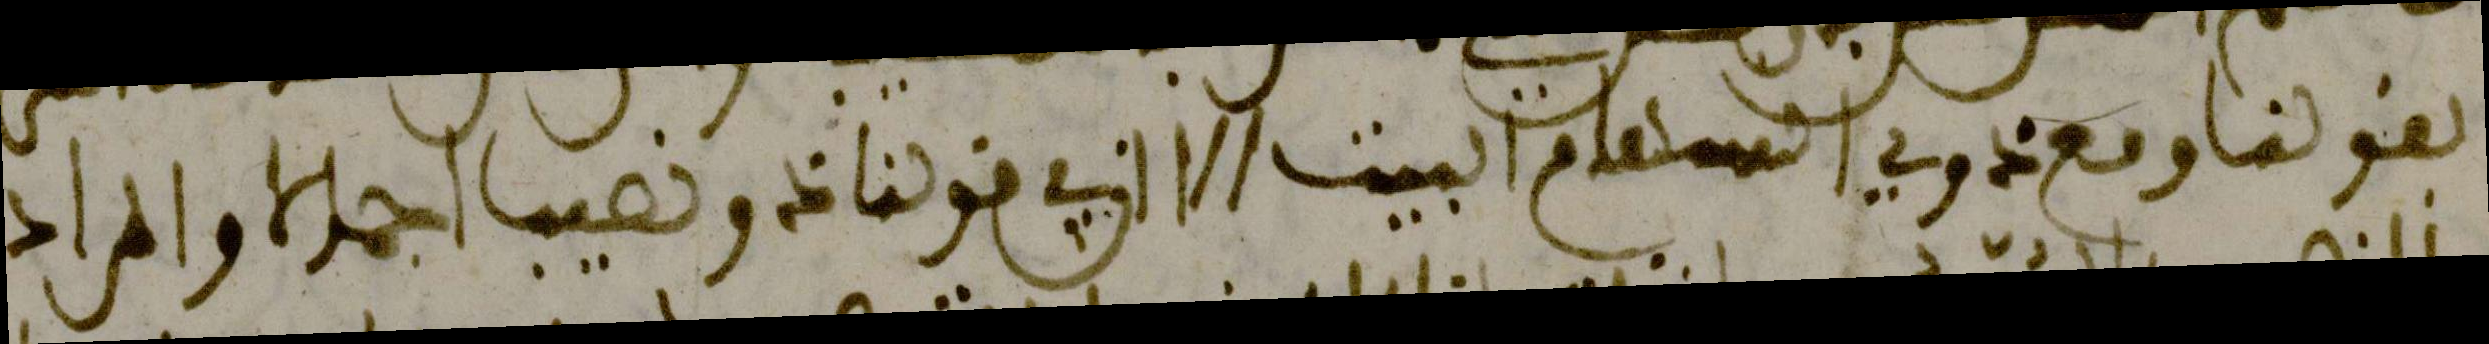بقولنا ومع ذوي السهام البيت الا ان في قولنا ذو نصيب اجمالا والمراد
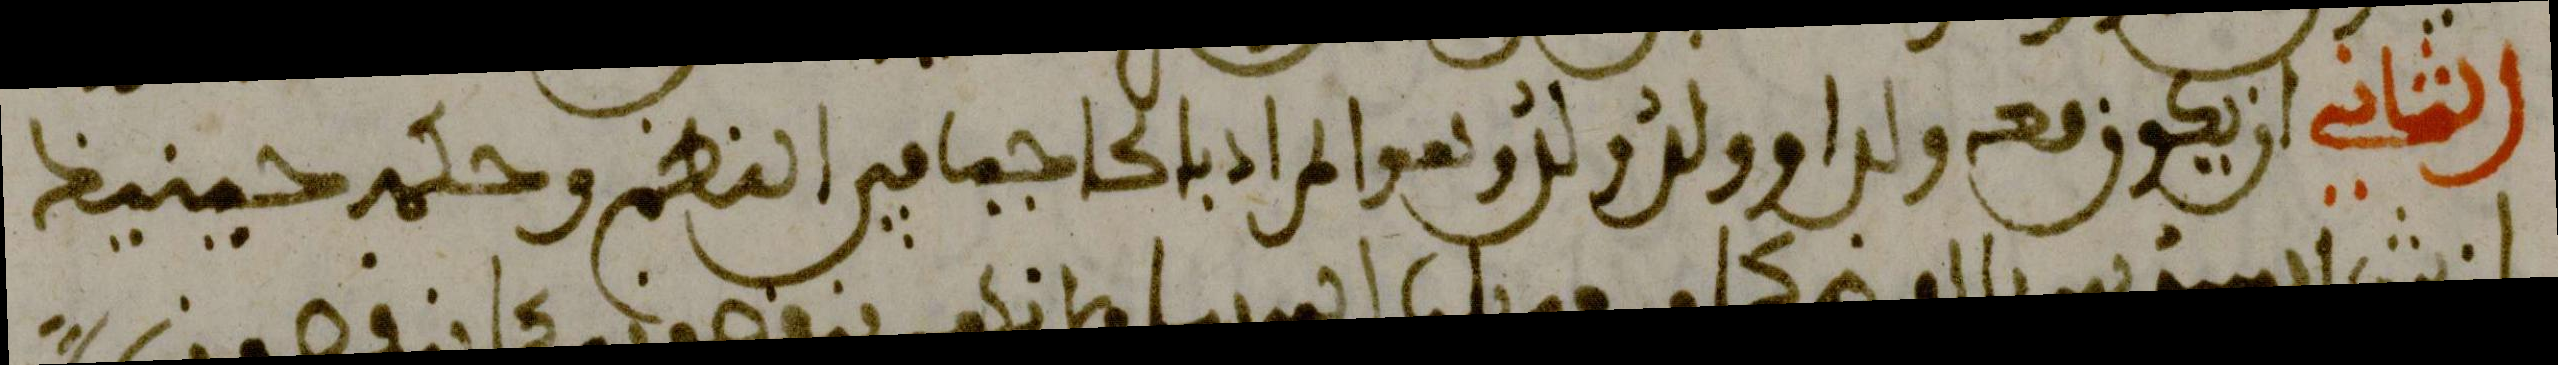الثاني ان يكون معه ولد او ولد ولد وهو المراد بالحاجب في النظم وحكمه حينيذ
